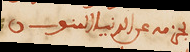بحزمه عن الدنيا المنو ن
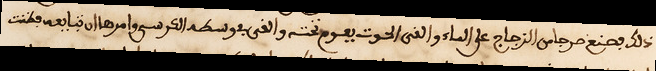ذلك فصنع صرجا من الزجاج على الماء والقى الحوت بعوم تحته والقى في وسطه الكرسى وامرها ان تبايعه فظنت
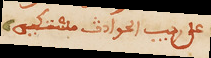على ريب الحوادث مستكين
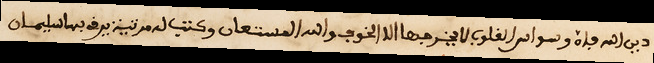دين الله فان وسواس القلوب لا يخرجها الا الخوف والله المستعان وكتب له مرتية يرق بها سليمان
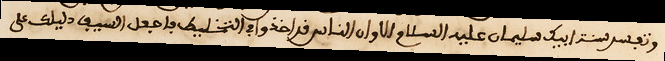وتفسد سنة ابيك سليمان عليه السلام الاوان الناس قد اخذوا في التخليط فاجعل السيف دليلك على
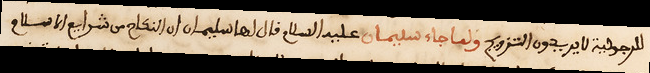للرجولية لا يريدون التزويج ولما جاء سليمان عليه السلام قال لها سليمان ان النكاح من شرايع الاسلام
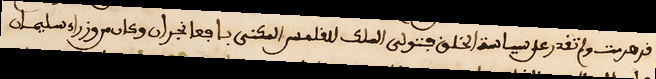قد هرمت ولم تقدر على سياسة الخلق فتولى الملك للقلمس المكنى بافعا نجران وكان من وزراء سليمان
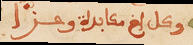وكل اخ مكابدة وعزا
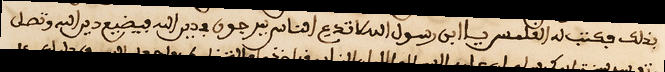بذلك فكتب له القلمس يا ابن رسول الله لا تدع الناس يمرجون في دين الله فيضيع دين الله وتصل
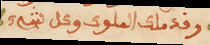وقد ملك الملوك وكل شىء
